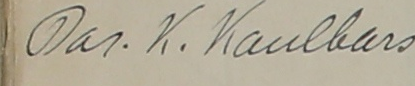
Bar. K. Kaulbars
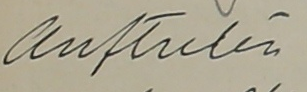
Auftreten
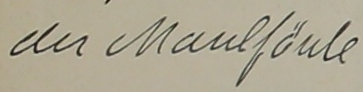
der Maulfäule
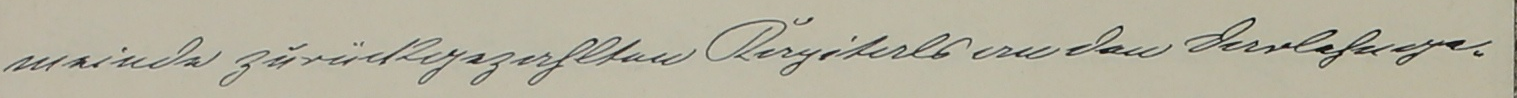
meinde zurückgezahlten Kapitals an den Darlehnge-
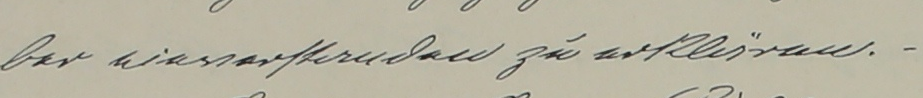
ber einverstanden zu erklären.
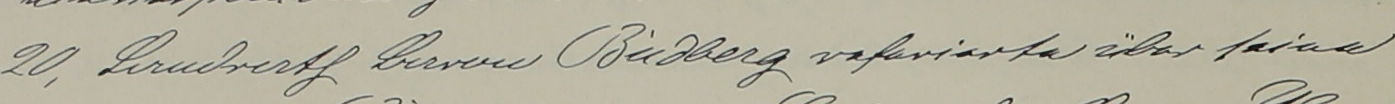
20. Landrath Baron Budberg referierte über seine
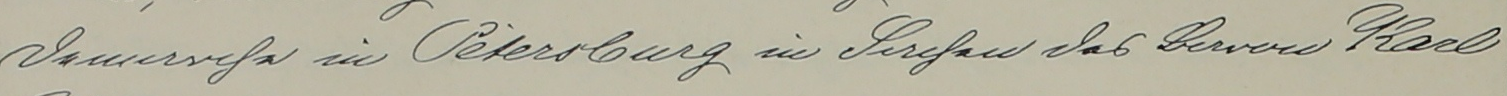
Demarche in Petersburg in Sachen des Baron Karl
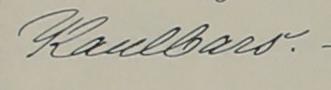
Kaulbars.
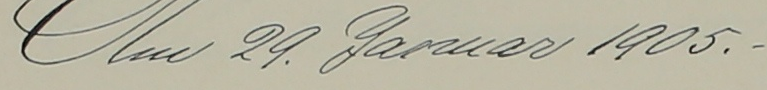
Am 29. Januar 1905.
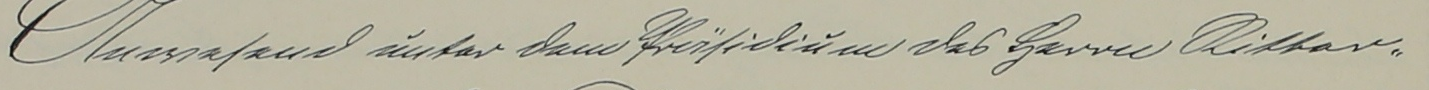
Anwesend unter dem Präsidium des Herrn Ritter-
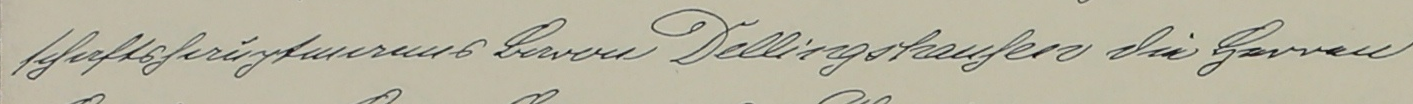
schaftshauptmanns Baron Dellingshausen die Herren
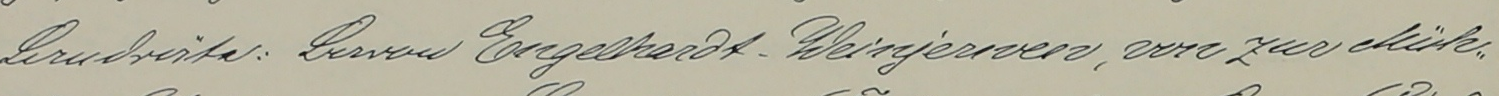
Landräte: Baron Engelhardt-Weinjerwen, von zur Müh-
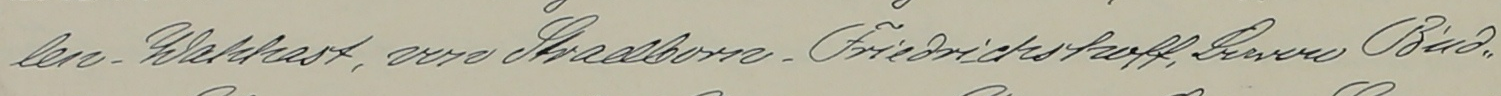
len-Wahhast, von Straelborn-Friedrichshoff, Baron Bud-
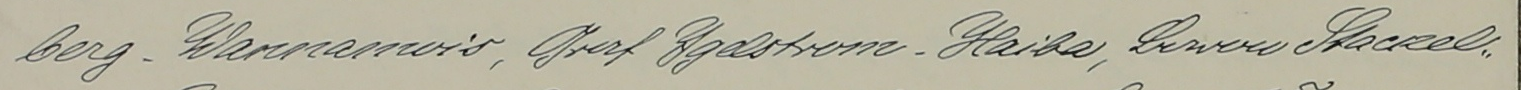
berg-Wannamois, Graf Igelstrom-Haiba, Baron Stackel-
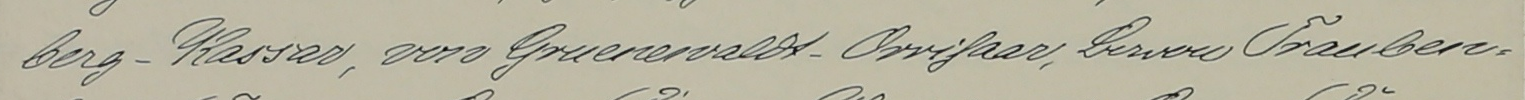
berg-Kassar, von Gruenewaldt-Orrisaar, Baron Trauben-
